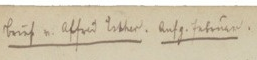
Brief v. Alfred Escher.
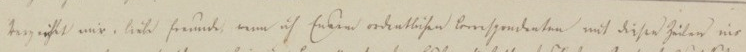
Verzeiht mir, liebe Freunde, wenn ich Euerm ordentlichen Correspondenten mit diesen Zeilen ins
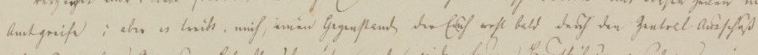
Amt greife; aber es treibt mich, einen Gegenstand, der Euch recht bald durch den Zentral Ausschuß
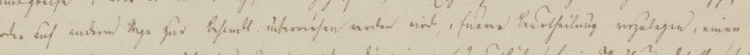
oder auf anderm Wege zur Behandl. überwiesen werden wird, Euerer Beurtheilung vorzulegen, einen
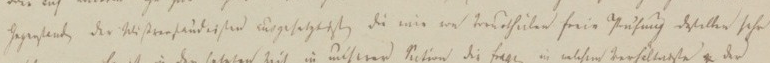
Gegenstand, der Mißverständnissen ausgesetzt ist, die eine von Vorurtheilen freie Prüfung desselben sehr
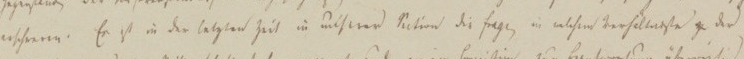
erschweren. Es ist in der letzten Zeit in unserer Section die Frage, in welchem Verhältnisse z der
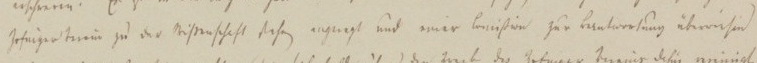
Zofinger Verein zu der Wissenschaft stehe, angeregt und einer Comission zur Beantwortung überwiesen
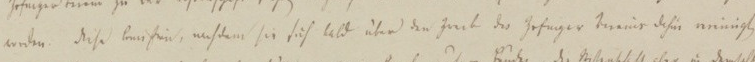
worden. Diese Comission, nachdem sie sich bald über den Zweck des Zofinger Vereins dahin vereinigt,
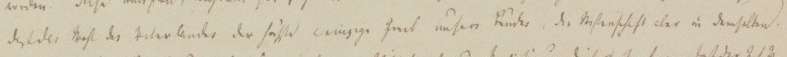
daß das Wohl des Vaterlandes der höchste & einzige Zweck unsers Bundes, die Wissenschaft aber in demselben
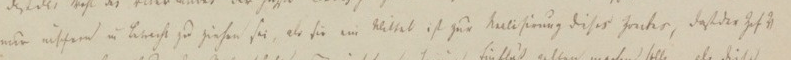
nur insofern in Betracht zu ziehen sei, als sie ein Mittel ist zur Realisirung dieses Zweckes, daß der Zof.V.
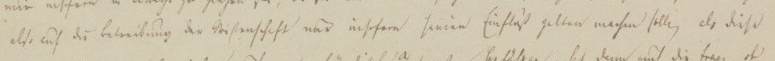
also auf die Betreibung der Wissenschaft nur insofern seinen Einfluß gelten machen solle, als diese
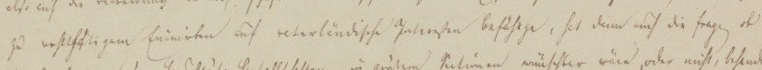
zu wohlthätigem Einwirken auf vaterländische Interessen befähige, hat denn auch die Frage, ob
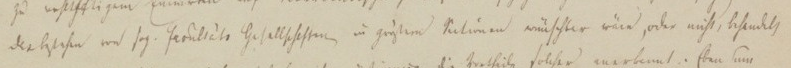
das Bestehen von sog. Facultäts Gesellschaften in größern Sectionen wünschbar wäre, oder nicht, behandelt,
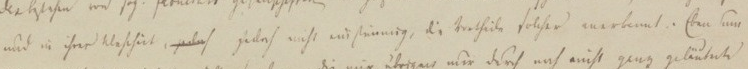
und in ihrer Mehrheit, jedoch jedoch nicht einstimmig, die Vortheile solcher anerkannt. Eben um
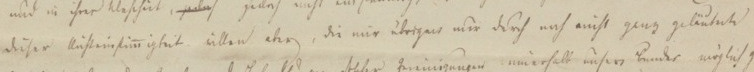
dieser Nichteinstimmigkeit willen aber, die mir übrigens nur durch noch nicht ganz geläuterte
